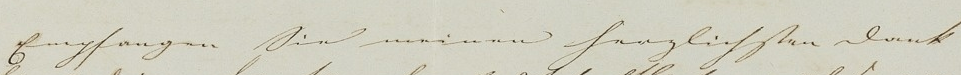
Empfangen Sie meinen herzlichsten Dank
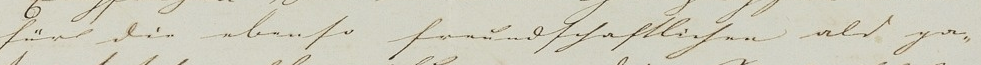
für die ebenso freundschaftlichen als pa-
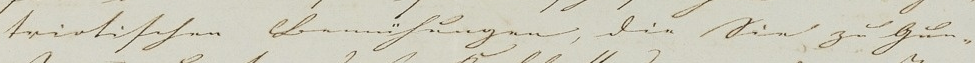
triotischen Bemühungen, die Sie zu Gun-
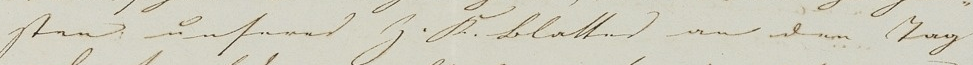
sten unseres Z. K.Blattes an den Tag
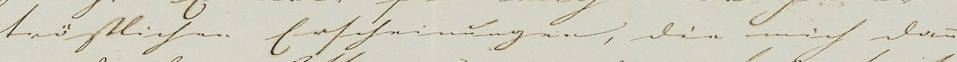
tröstlichen Erscheinungen, die mich dann
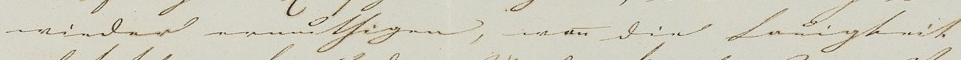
wieder ermuthigen, wenn die Lauigkeit
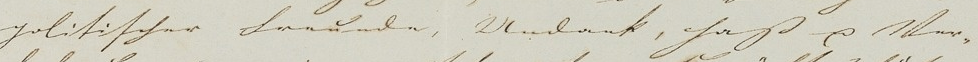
politischer Freunde, Undank, Haß & Ver-
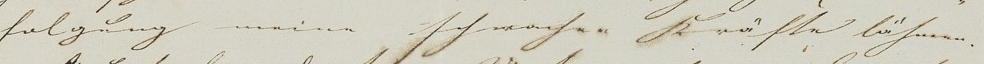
folgung meine schwachen Kräfte lähmen.
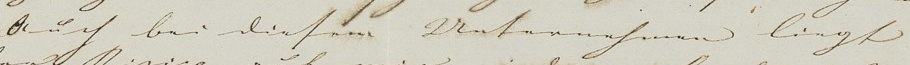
Auch bei diesem Unternehmen liegt
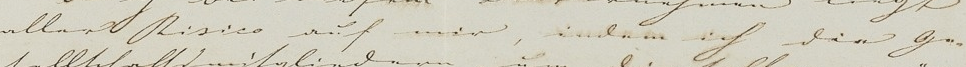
alles Risico auf mir, indem ich den Ge-
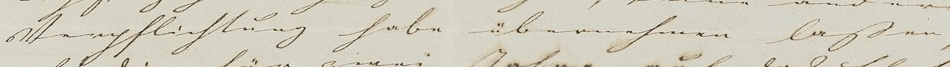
Verpflichtung habe übernehmen lassen,
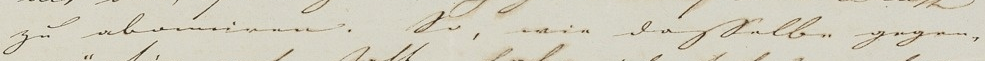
zu abonniren. So, wie dasselbe gegen-
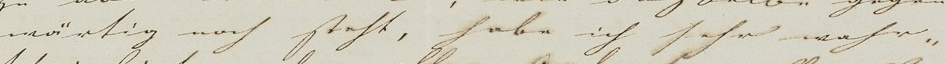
wärtig noch steht, habe ich sehr wahr-
